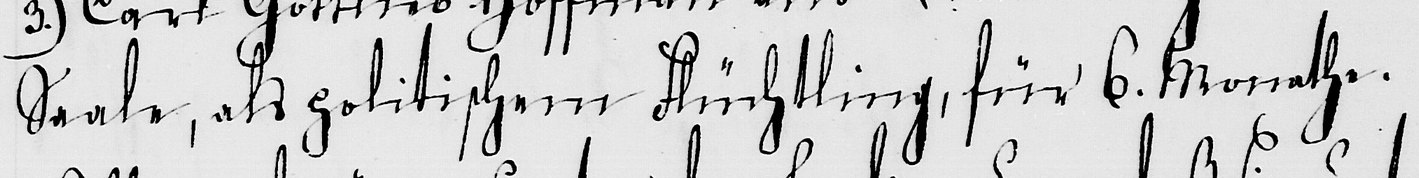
Saale, als politischem Flüchtling, für 6. Monathe.
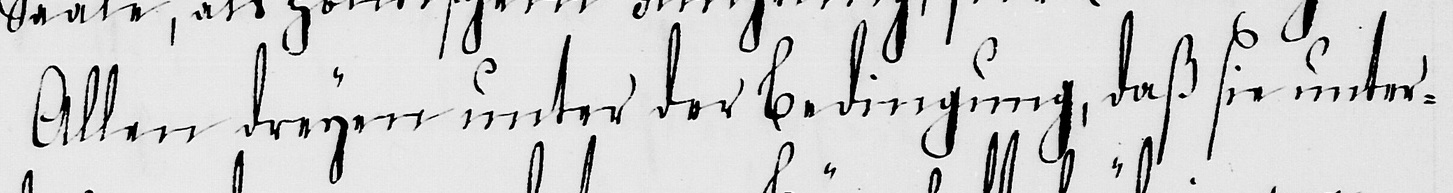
Allen dreyen unter der Bedingung, daß sie unter¬
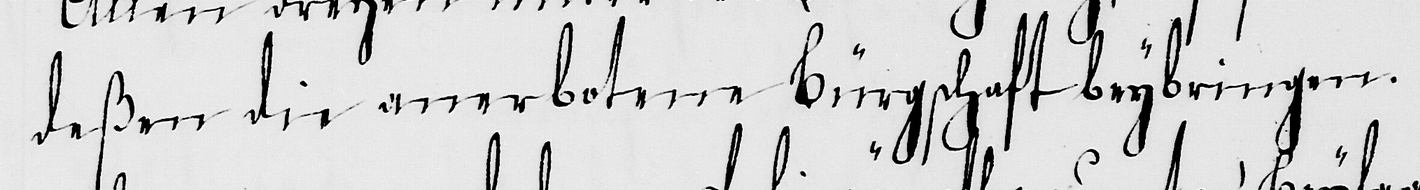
deßen die anerbotene Bürgschaft beybringen.
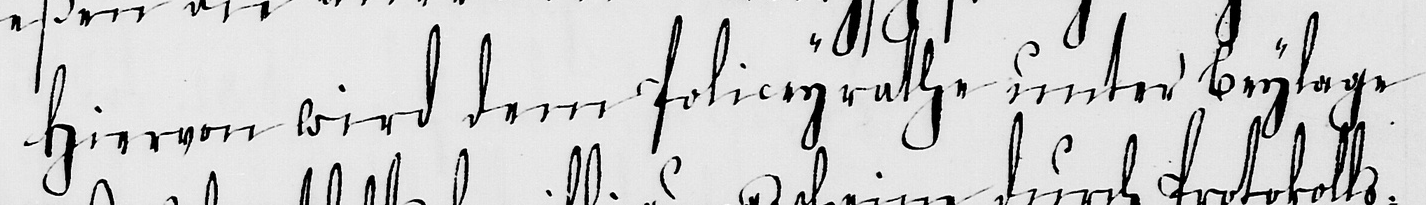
Hiervon wird dem Policeyrathe unter Beylage
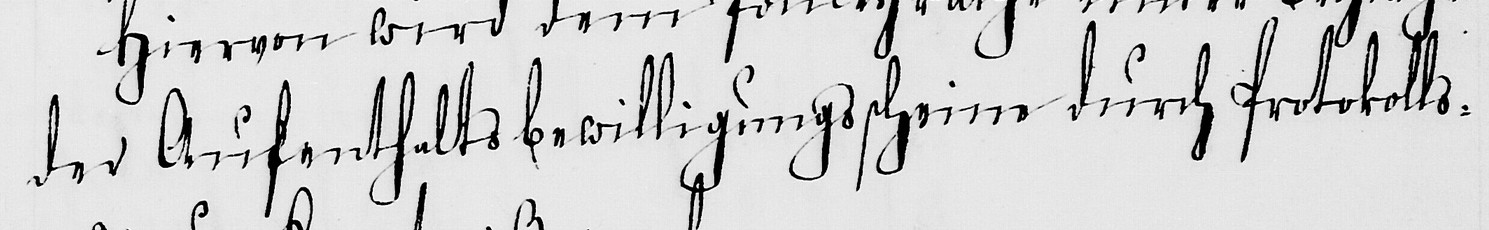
der Aufenthaltsbewilligungsscheine durch Protokoll¬
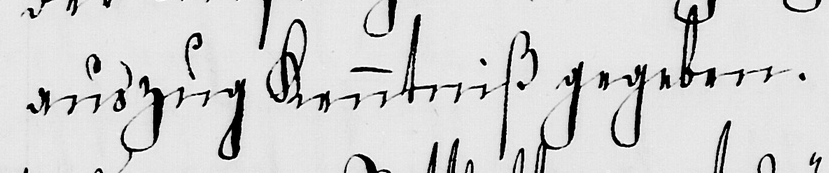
sauszug Kenntniß gegeben.
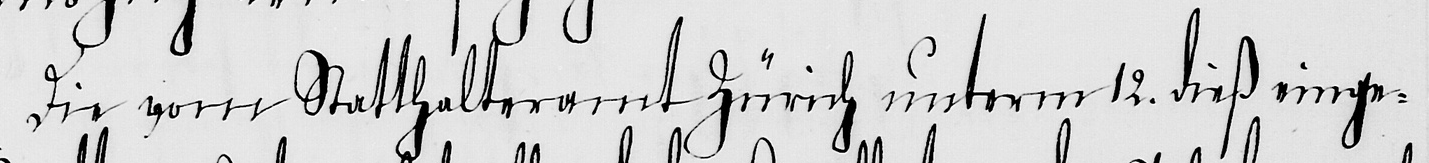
Die vom Statthalteramt Zürich unterm 12. dieß einge¬
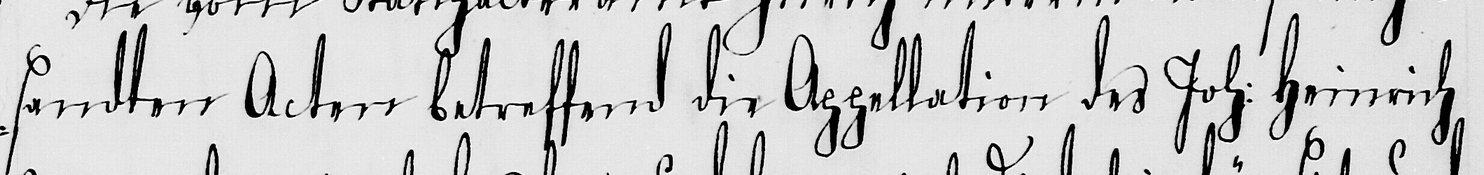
sandten Acten betreffend die Appellation des Joh:
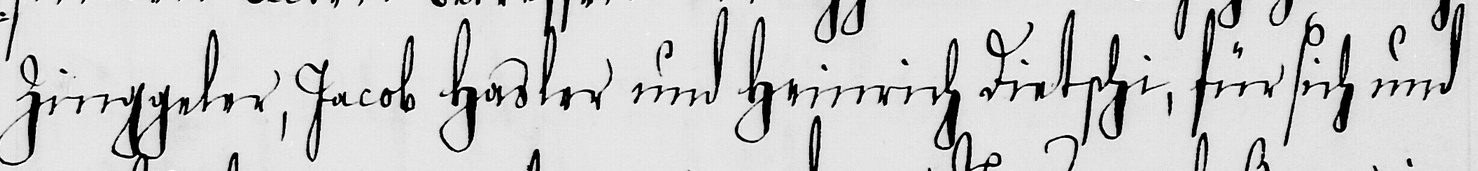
Zinggeler, Jacob Hasler und Heinrich Dietschi, für sich und
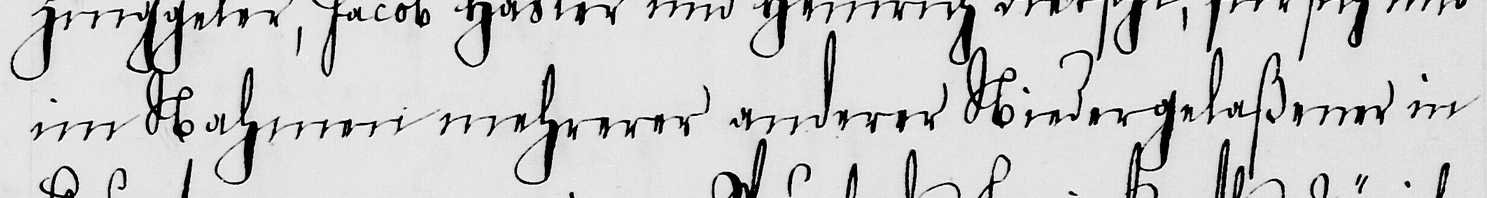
im Nahmen mehrerer anderer Niedergelaßener in
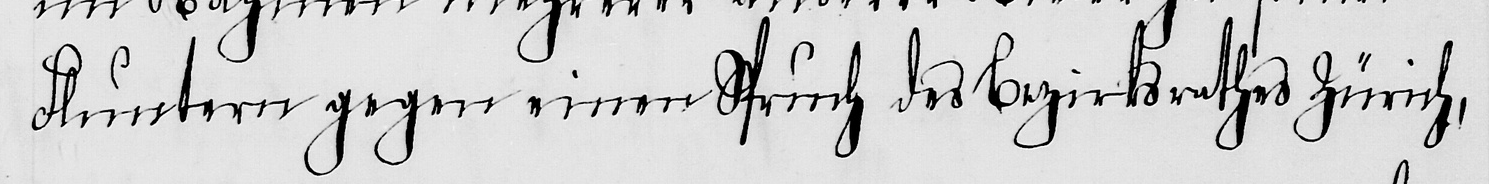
Fluntern gegen einen Spruch des Bezirksrathes Zürich,
